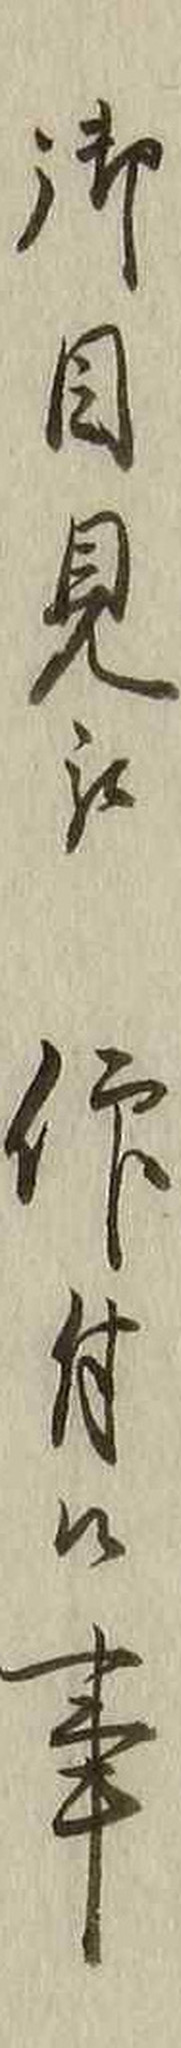御目見被仰付候事
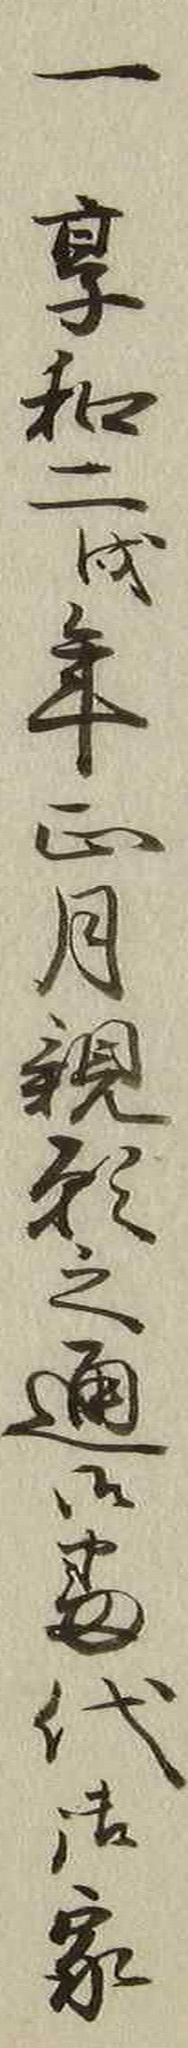一享和二戌年正月親願之通御番代御家
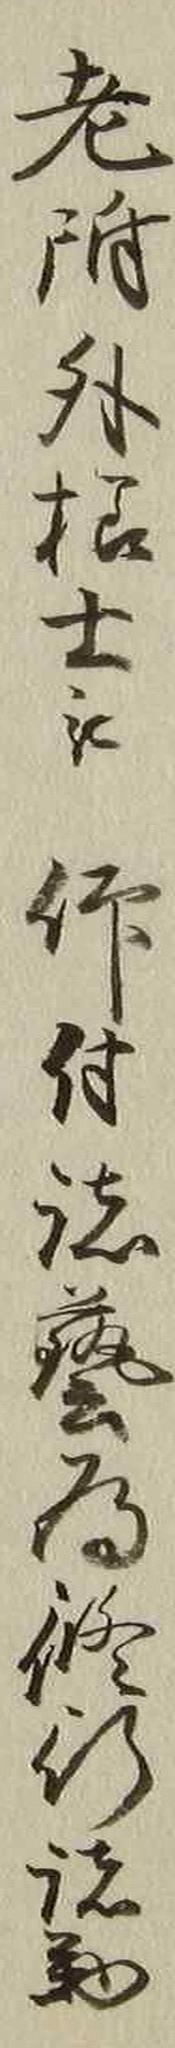老附外様士被仰付諸芸為修行諸勤
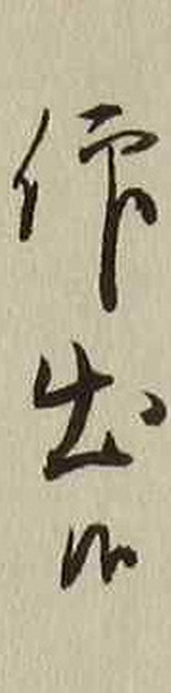仰出候
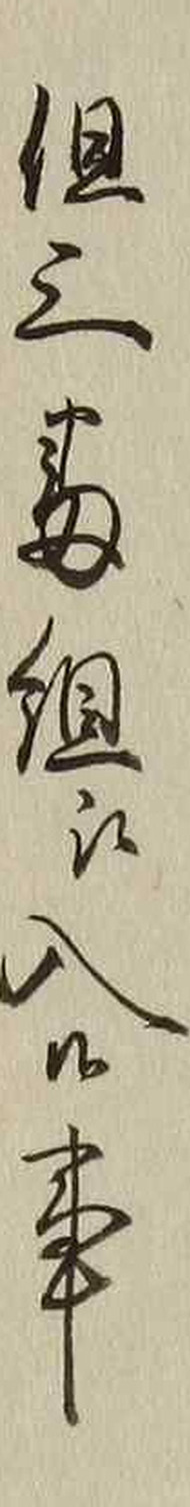但三番組江入候事
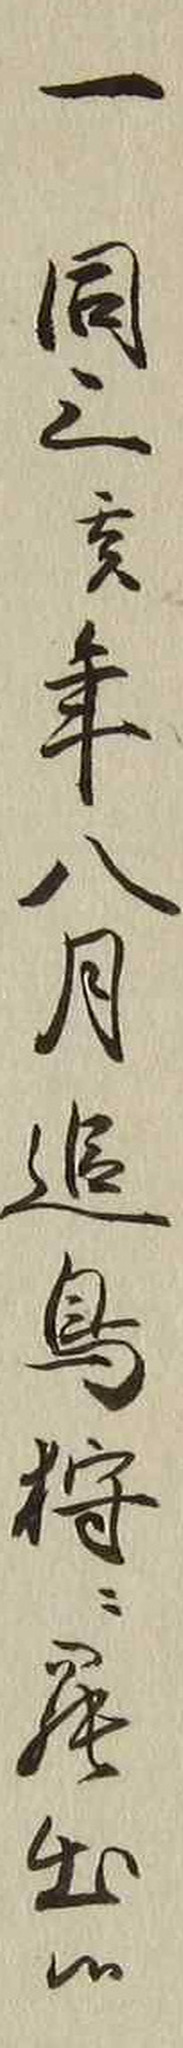一同三亥年八月追鳥狩ニ罷出候
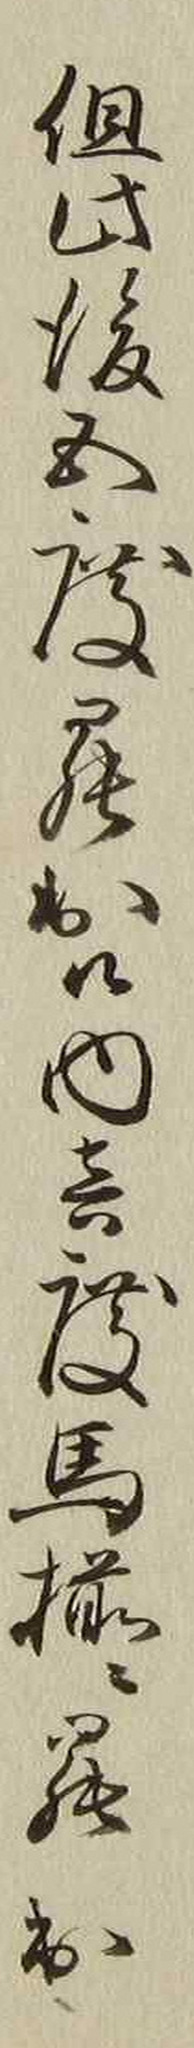但此後五度罷出候内壱度馬揃ニ罷出
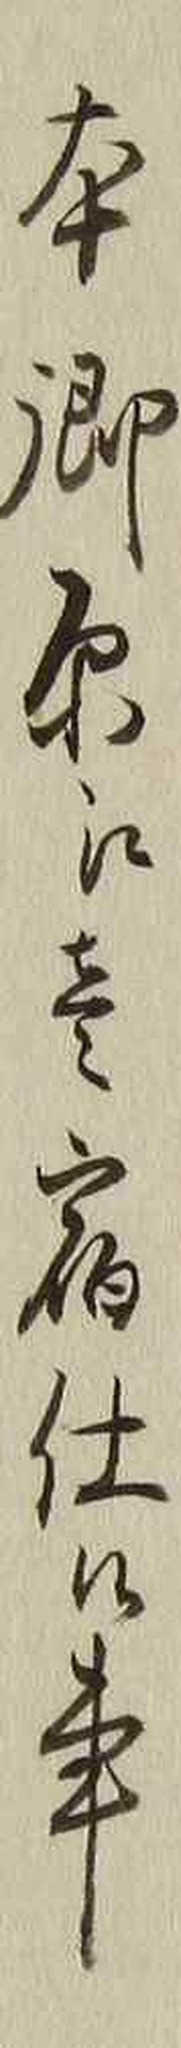本郷原江壱宿仕候事
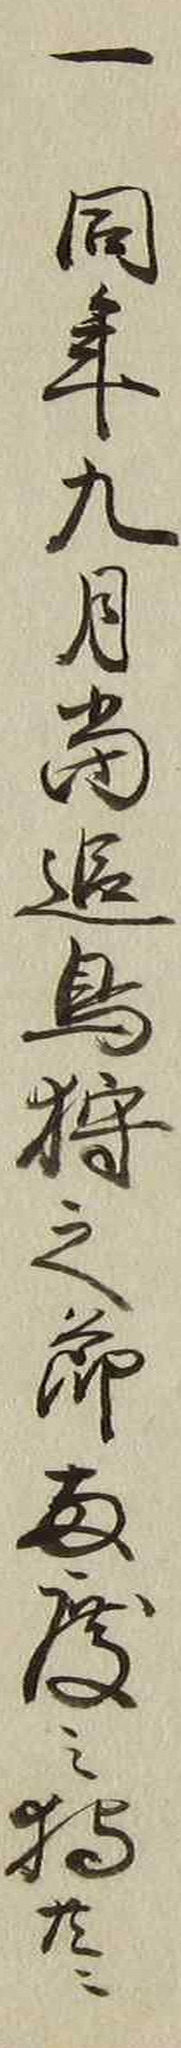一同年九月当追鳥狩之節両度之狩共ニ
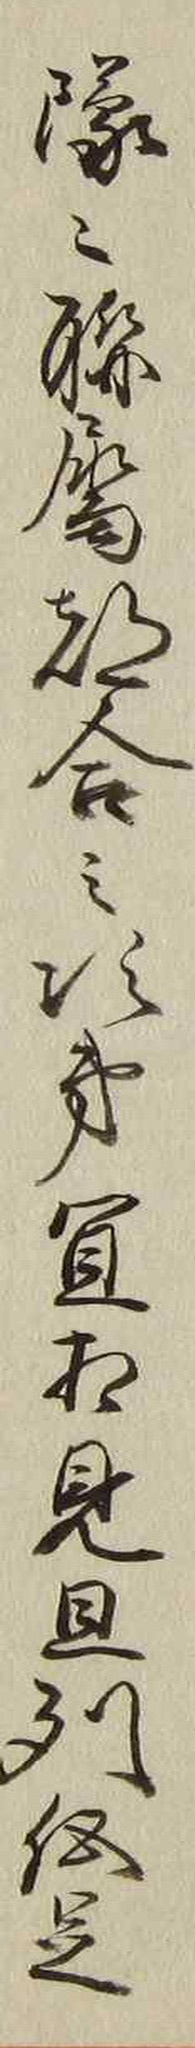隊々聯属都合之次第宜相見且列伍足
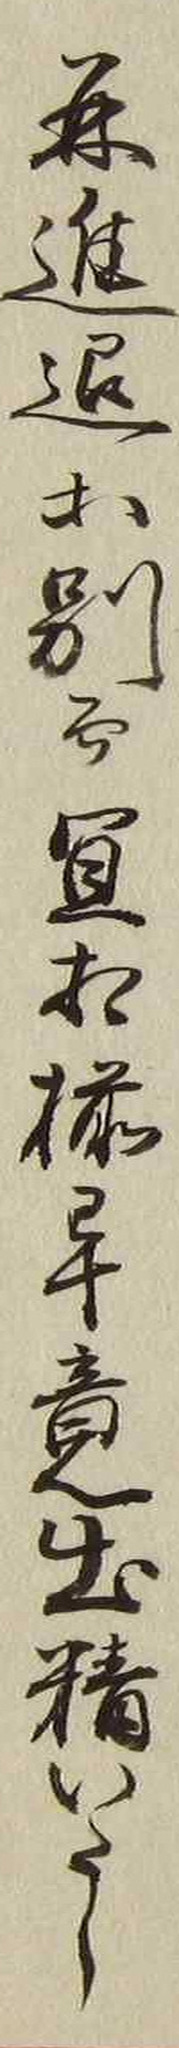並進退等別而宜相揃畢竟出精いたし
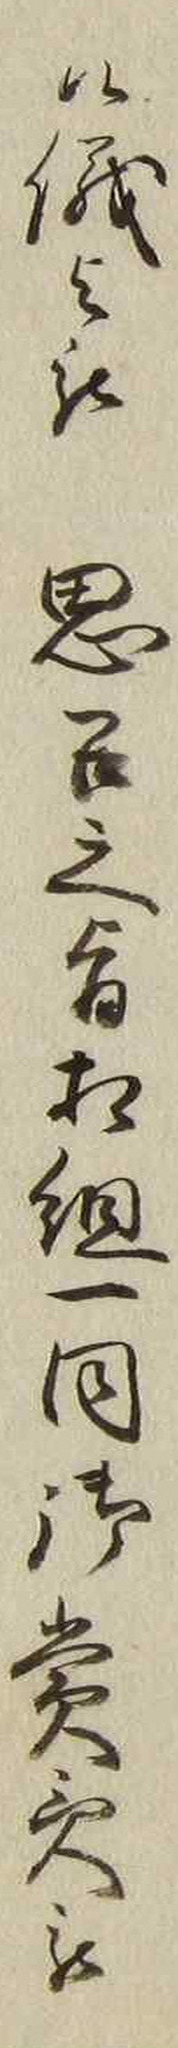候儀与被思召之旨相組一同御賞美被
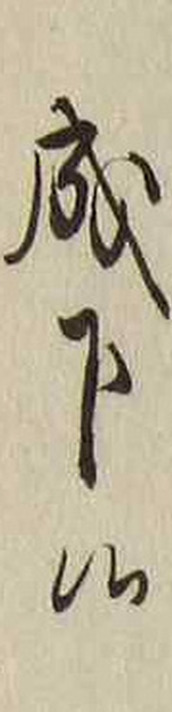成下候

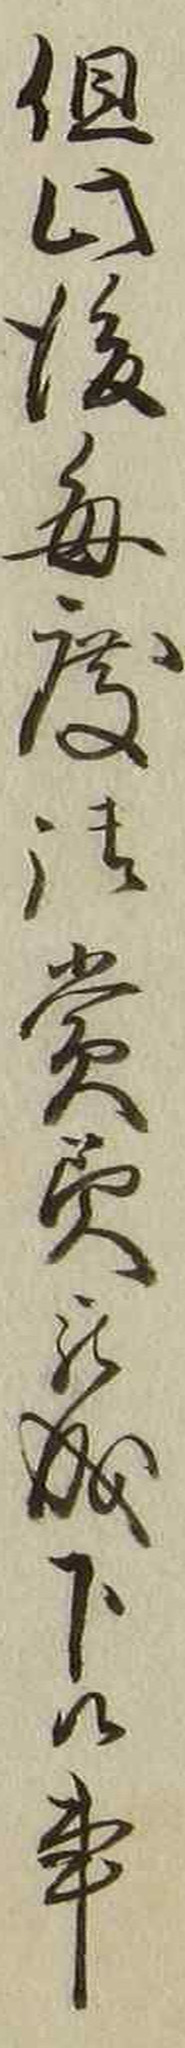但此後毎度御賞美被成下候事
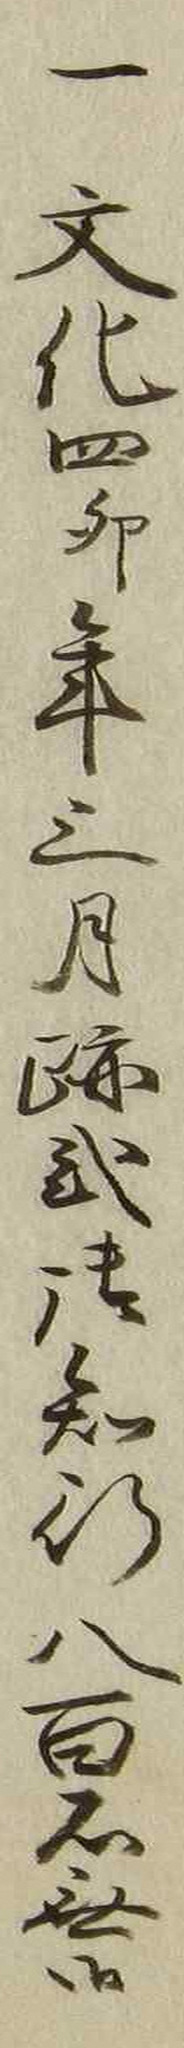一文化四卯年三月跡弐御知行八百石無御
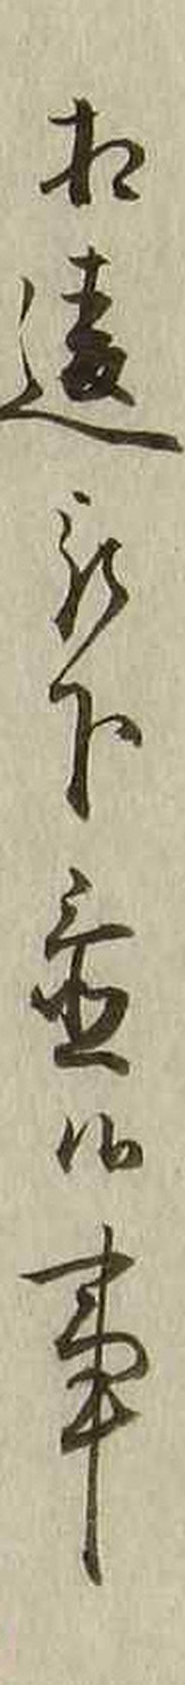相違被下置候事
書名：諸士系譜　巻之15　い之部15
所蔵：会津若松市立会津図書館
